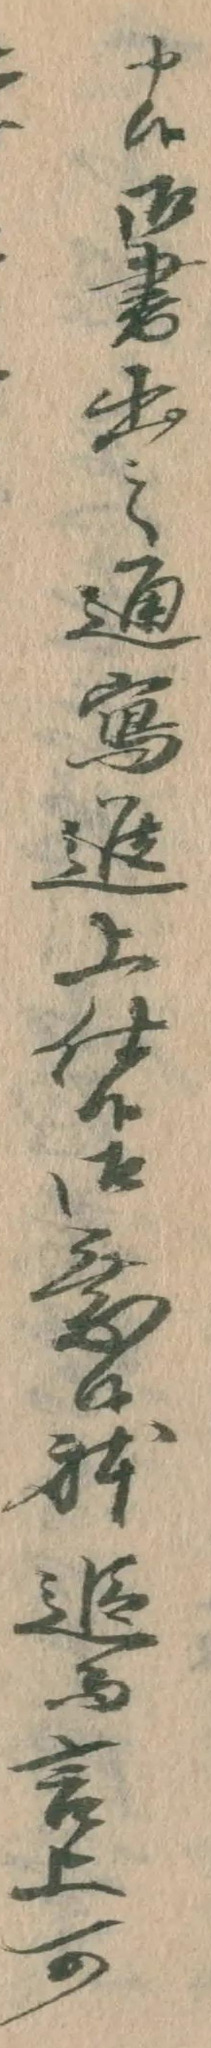申候御書出之通写進上仕候御乗候躰追而言上可
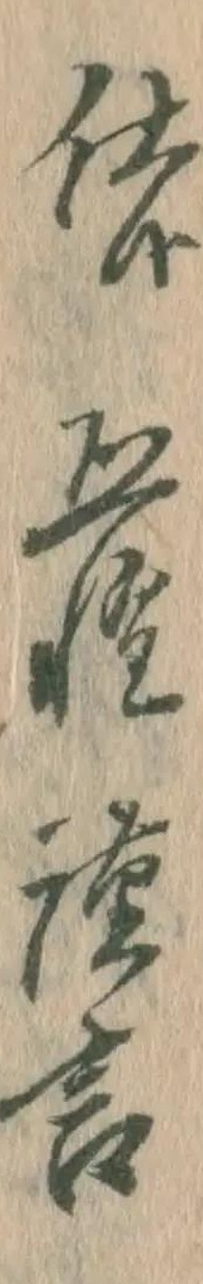仕候恐惶謹言
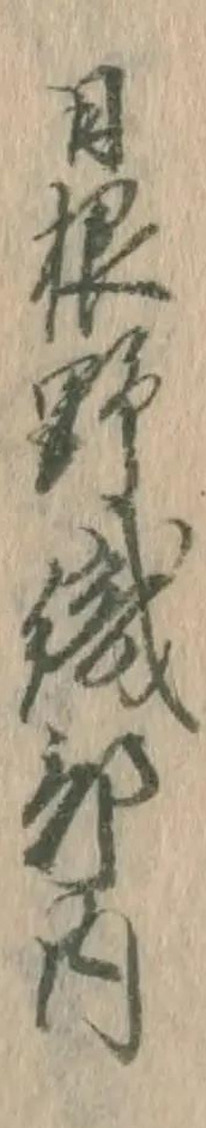日根野織部内
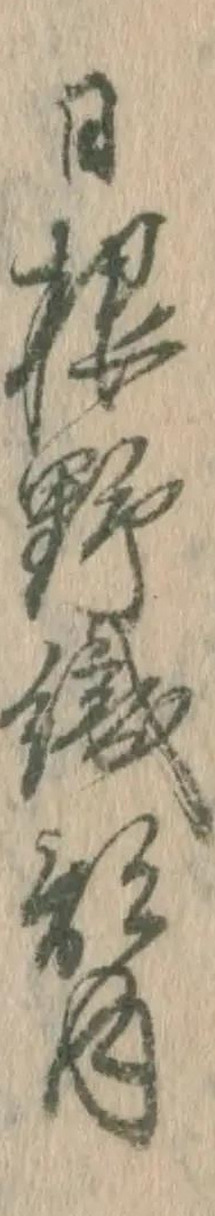日根野織部内
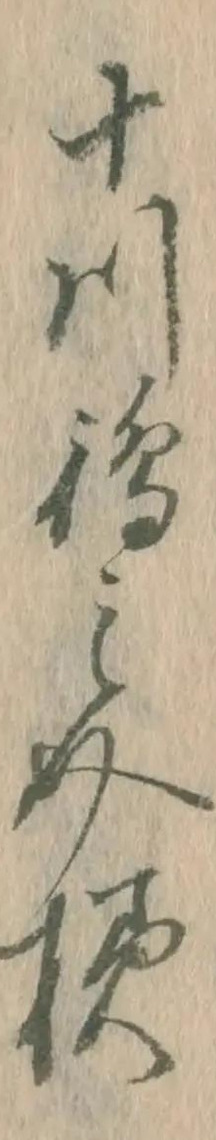十川嶋之介様

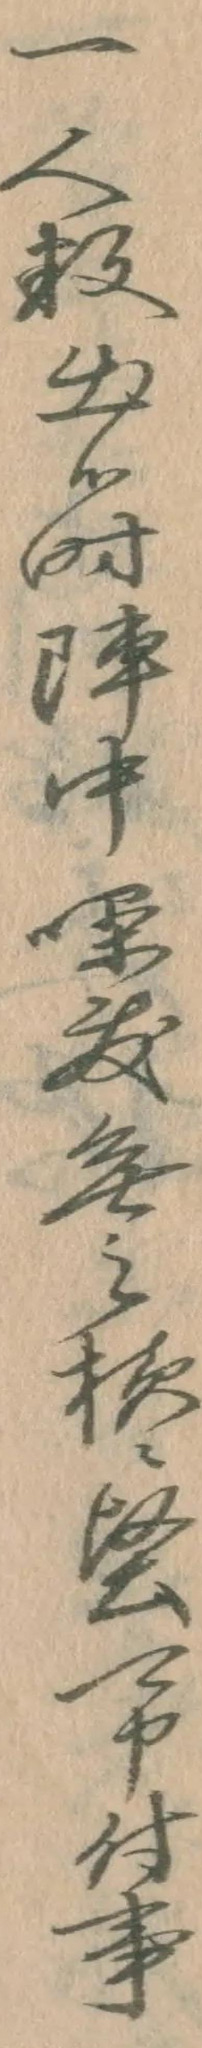一人数出候時陣中噪敷無之様に堅可申付事
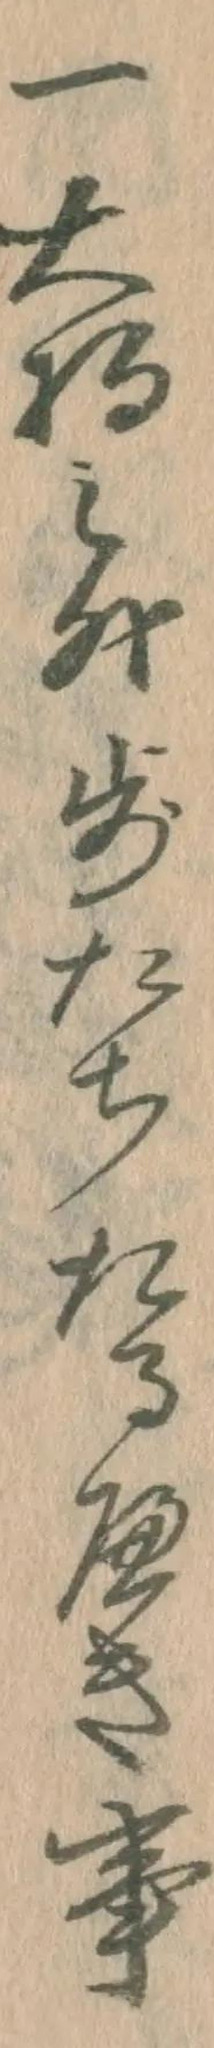一大将之外歩たちたる扁き事
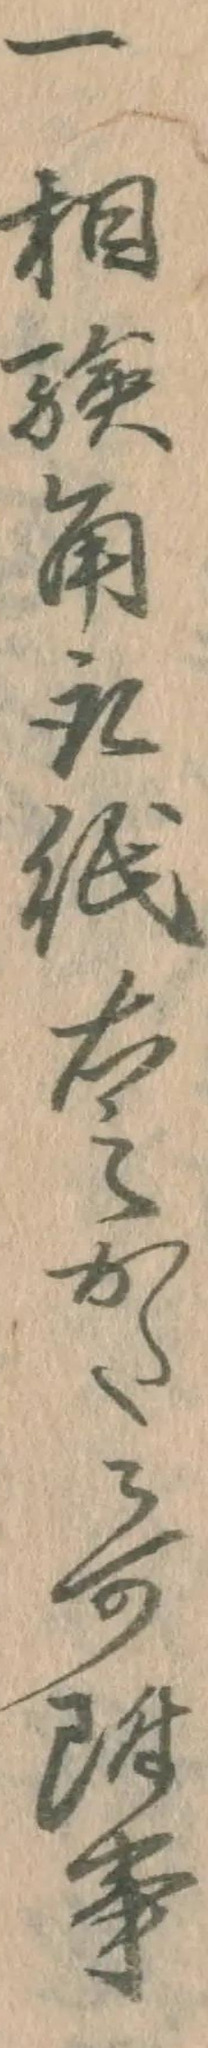一相験角取紙右之かたに可附事
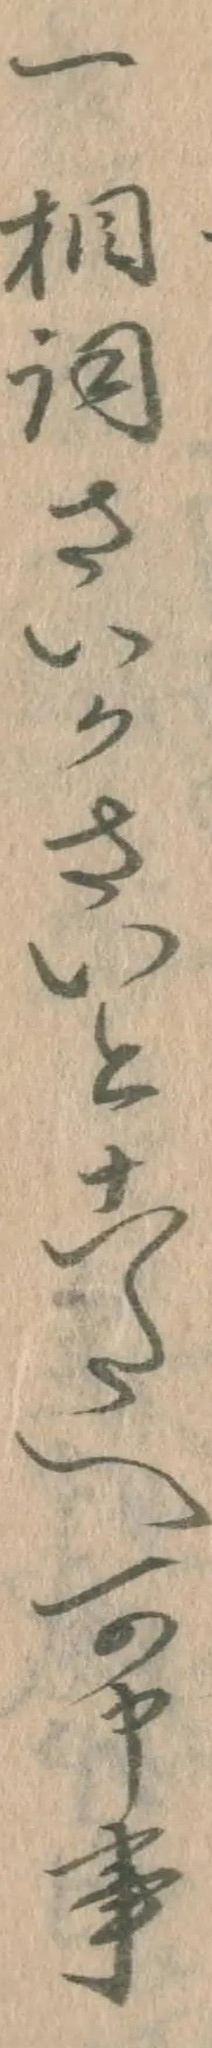一相詞さいかさいと古たへ可申事
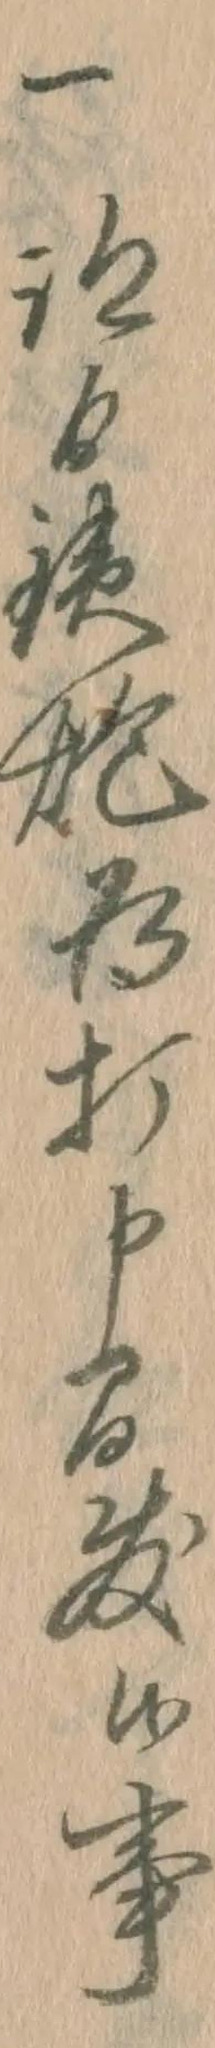一跡ゟ鉄砲為打申間敷候事
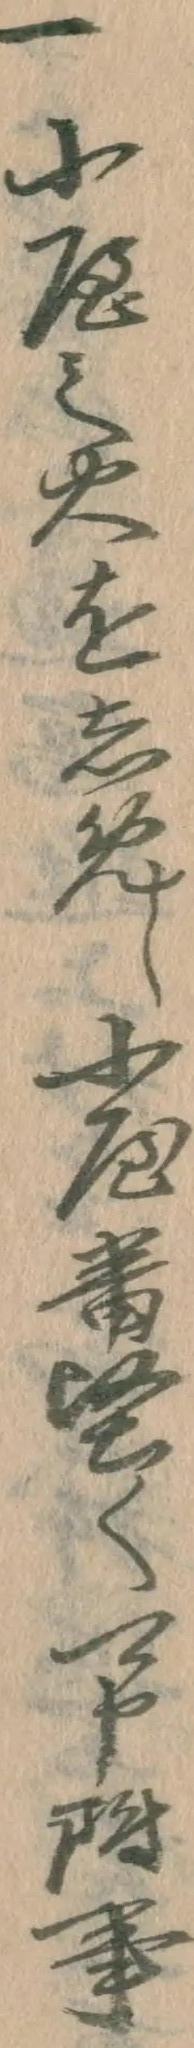一小屋之火を志免し小屋番堅く可申附事
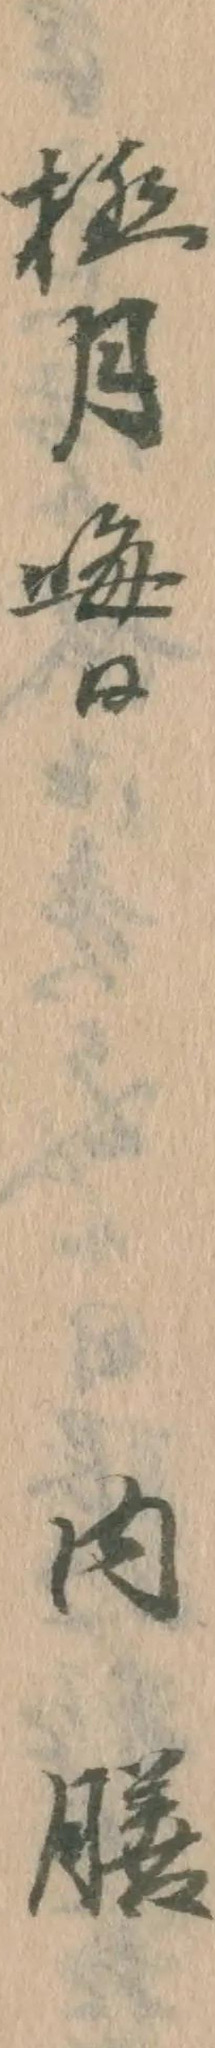極月晦日内膳
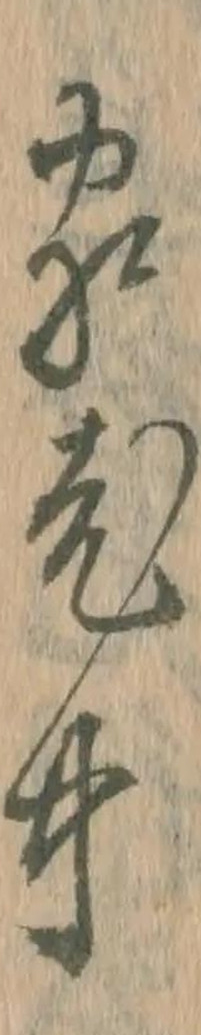家老中
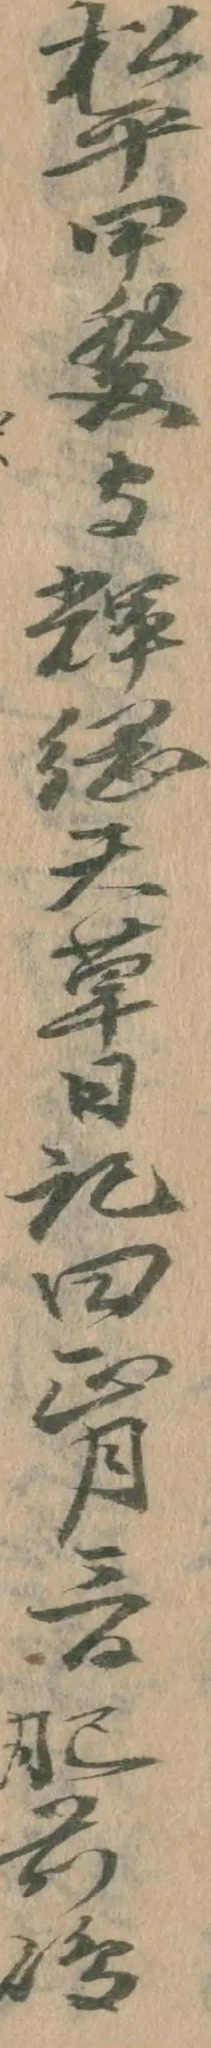松平甲斐守輝綱天草日記曰正月三日肥前島
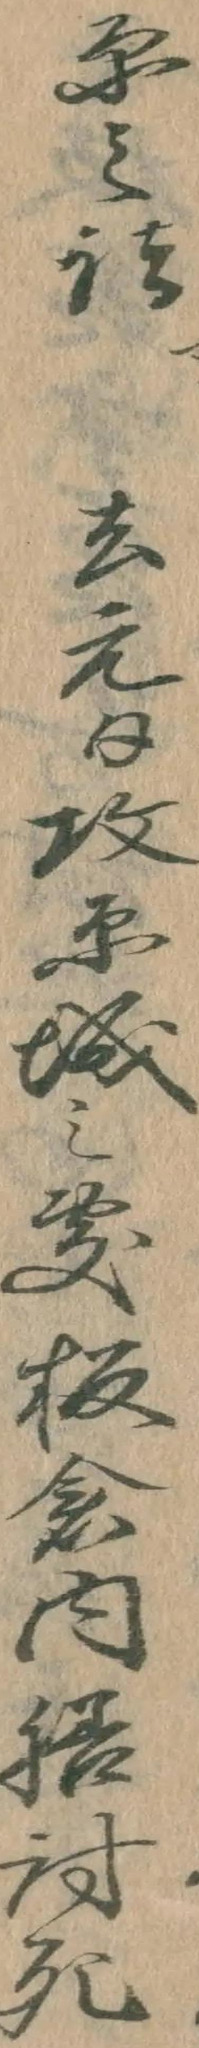原之諸去元日攻原城之處板倉内膳討死
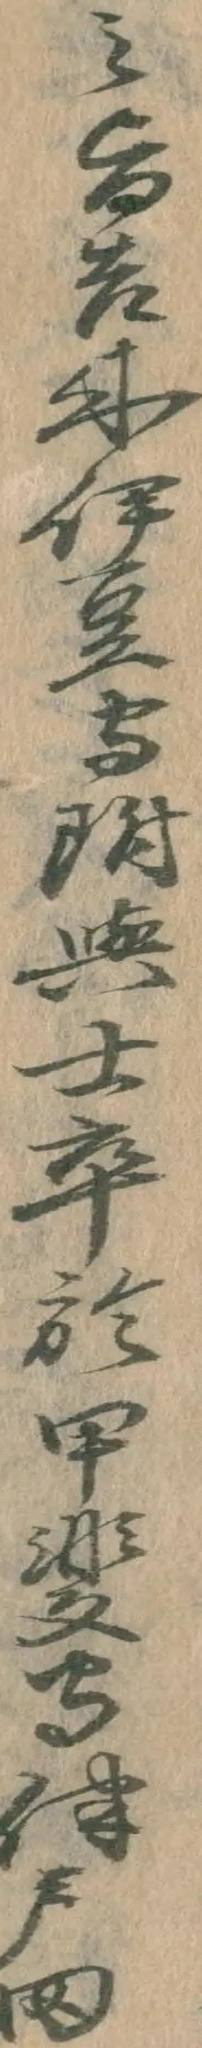之旨告来伊豆守附與士卒於甲斐守伴戸田
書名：切支丹御退治記 49巻. [5]
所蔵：国立国会図書館 National Diet Library, JAPAN
